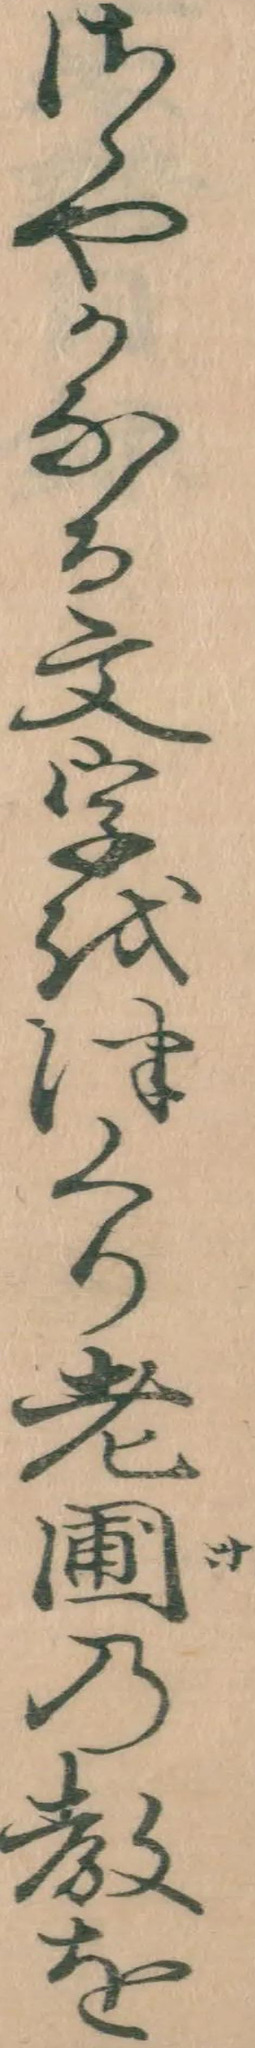さゝやかなる文字をつくり老圃の教を
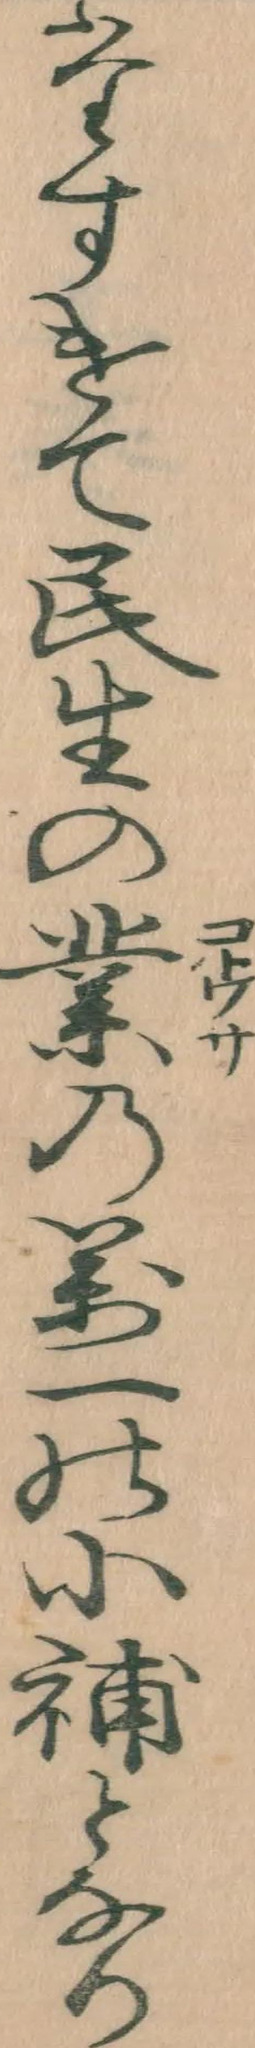たすけて民生の業の万一の小補となり
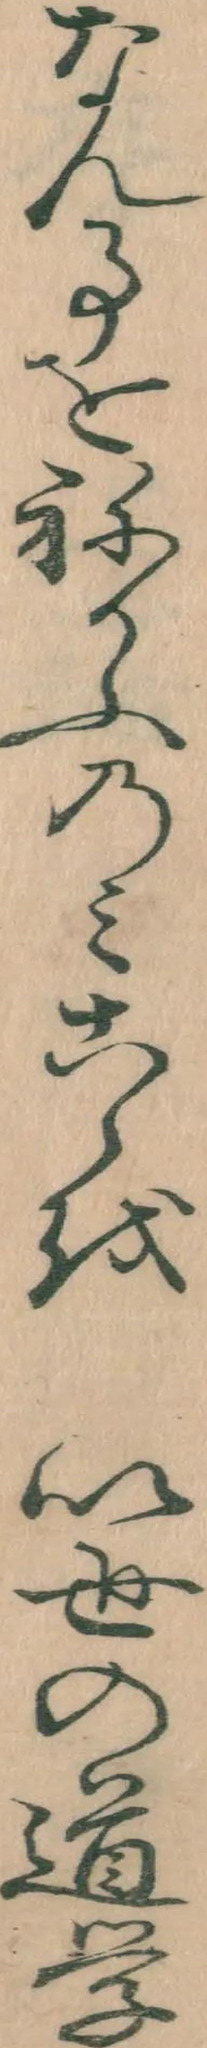なん事をねかふのみこゝを以世の道学
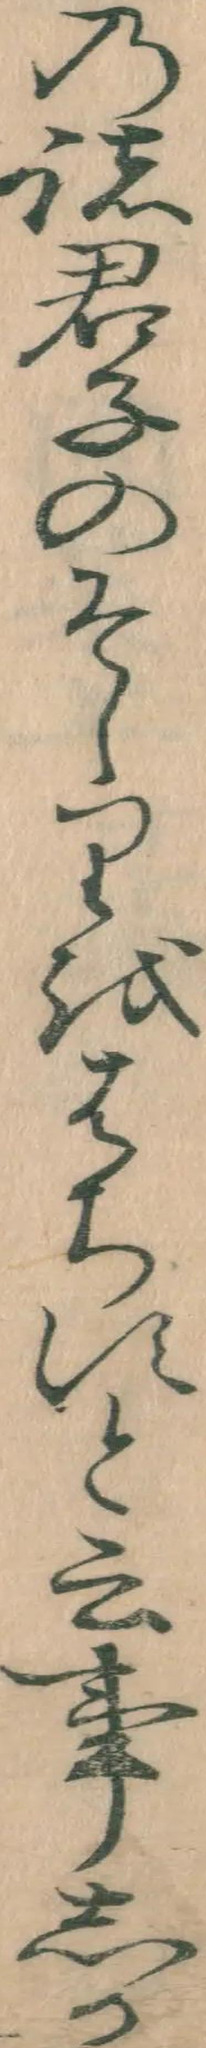の諸君子のそしりをはちすと云事しか
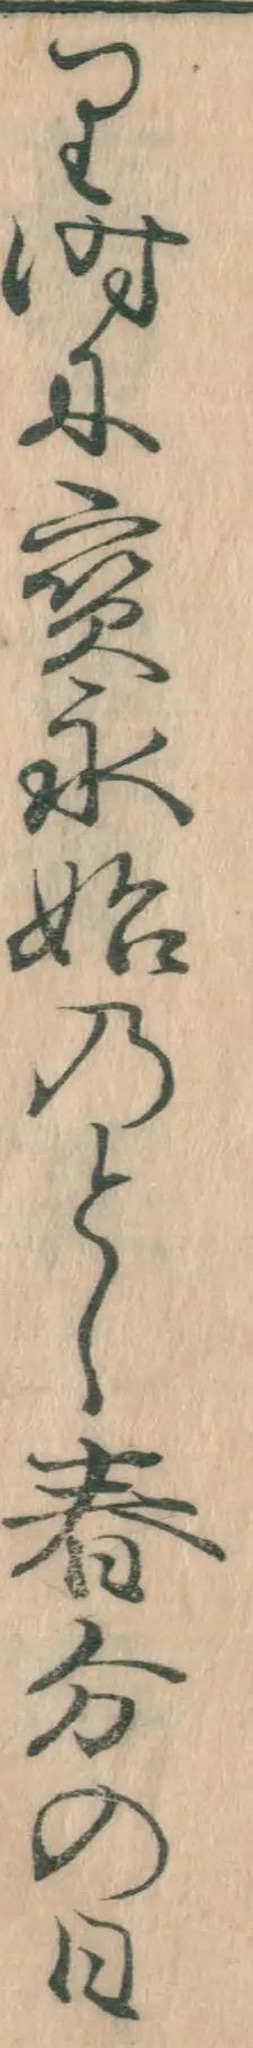り時に宝永始のとし春分の日
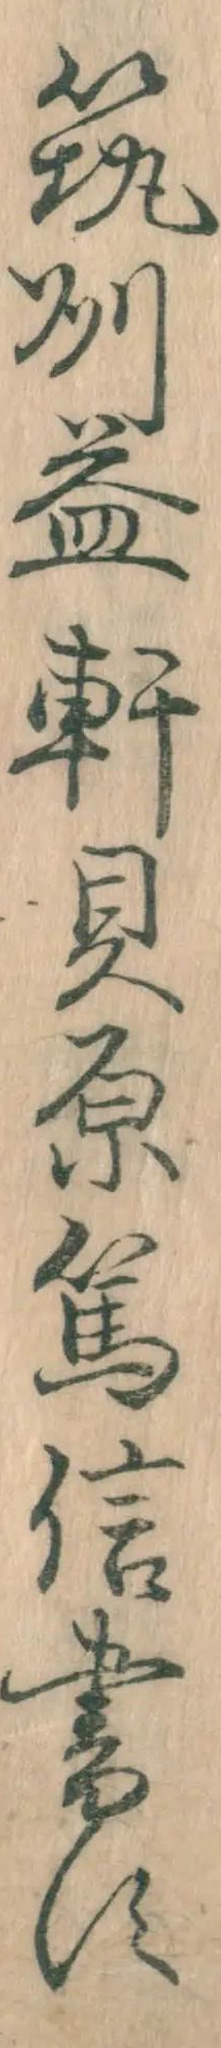築州益軒貝原篤信書す

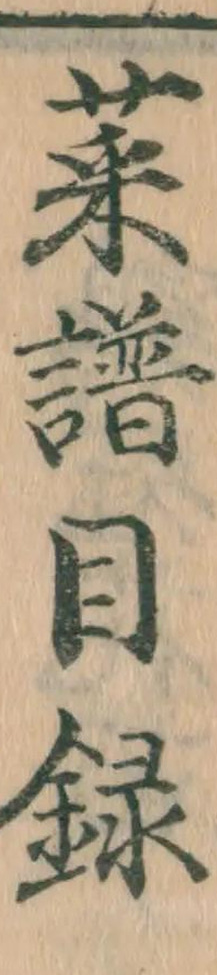菜譜目録
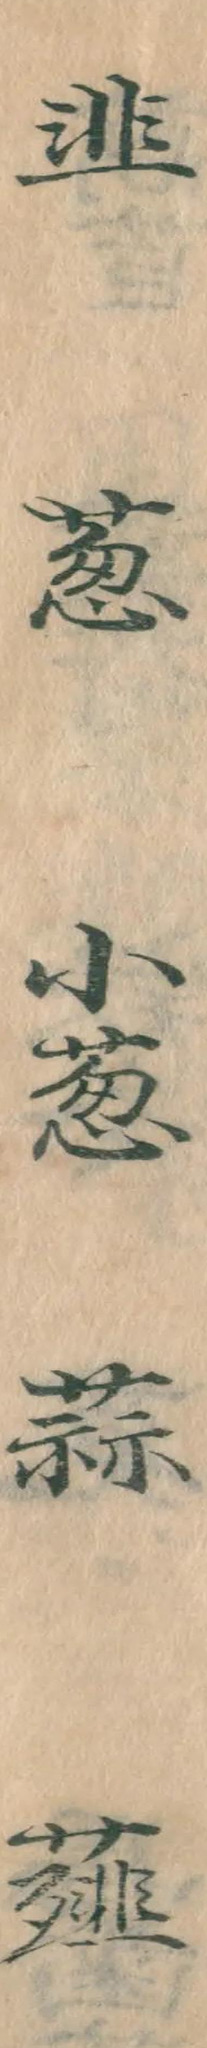韭葱小葱蒜薤
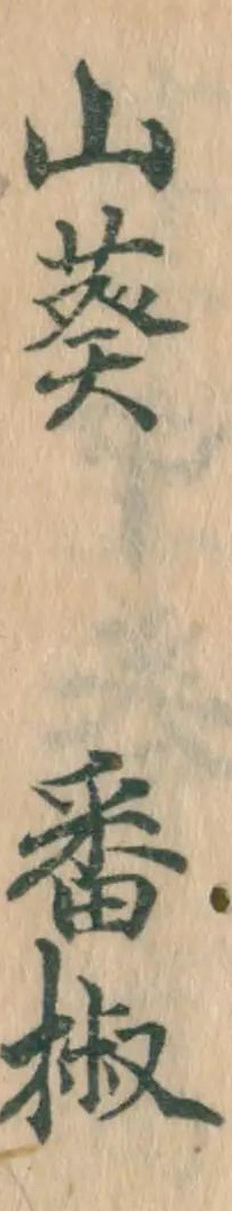山葵番椒

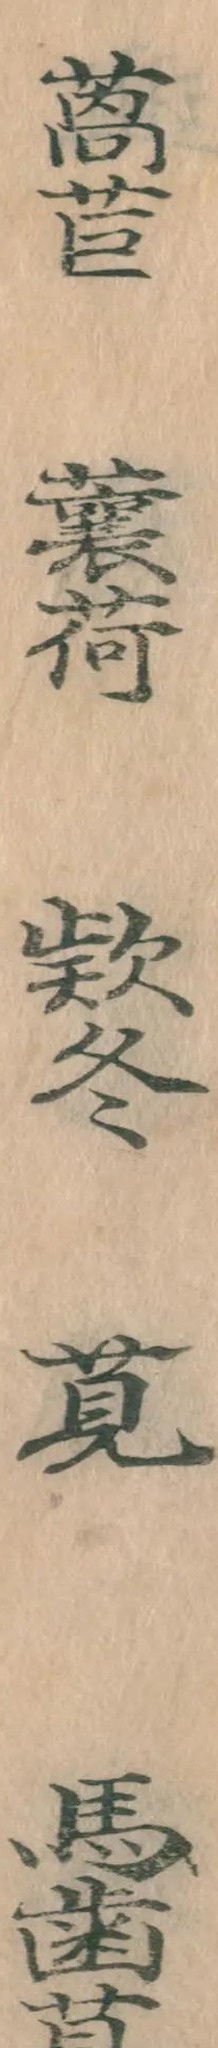萵苣蘘荷欵冬莧馬歯莧
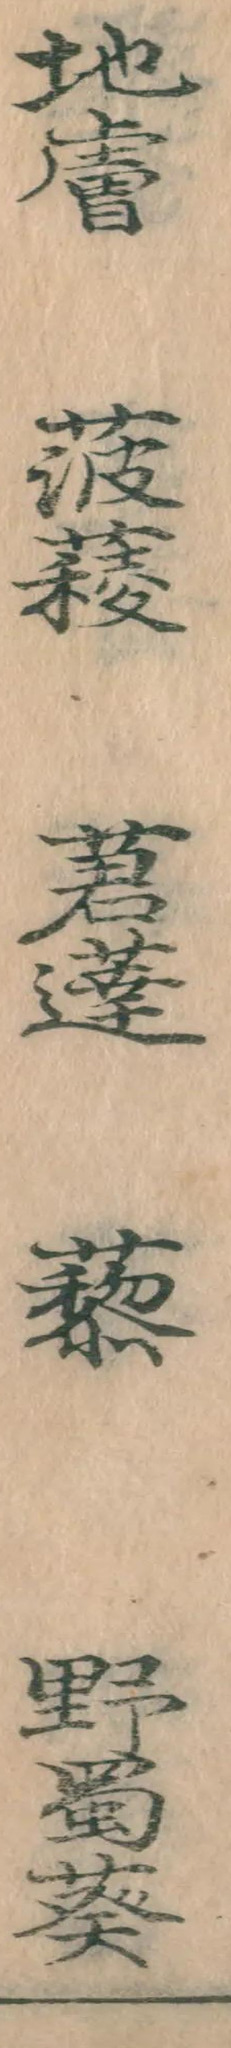地膚菠薐莙薘藜野蜀葵
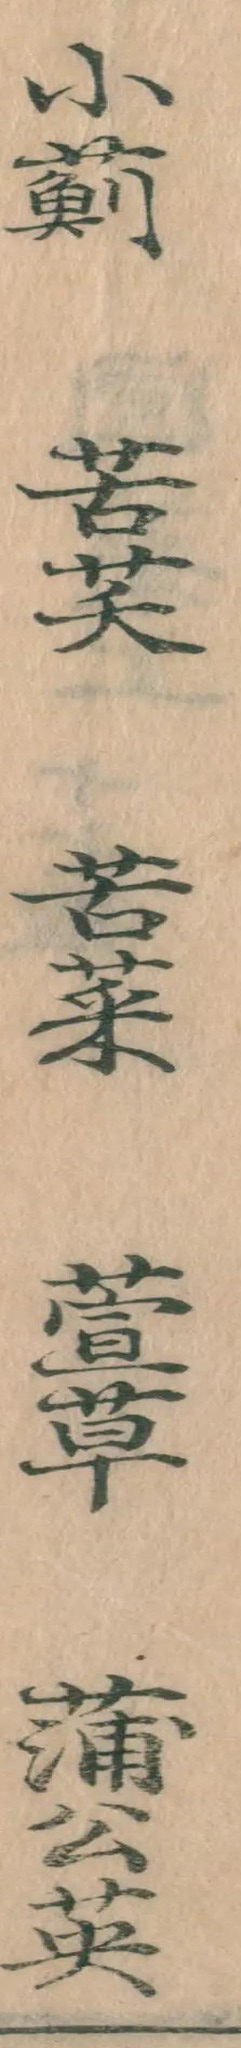小薊苦芺苦菜萱草蒲公英
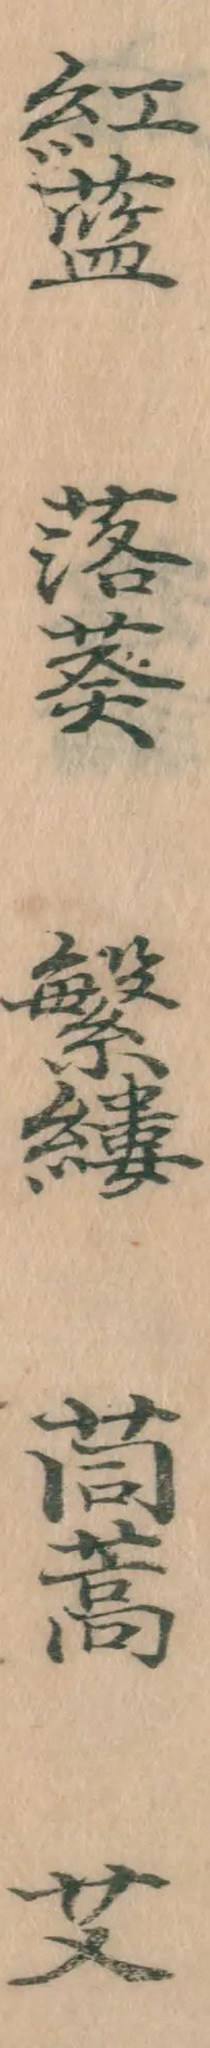紅藍落葵繁縷茼蒿艾
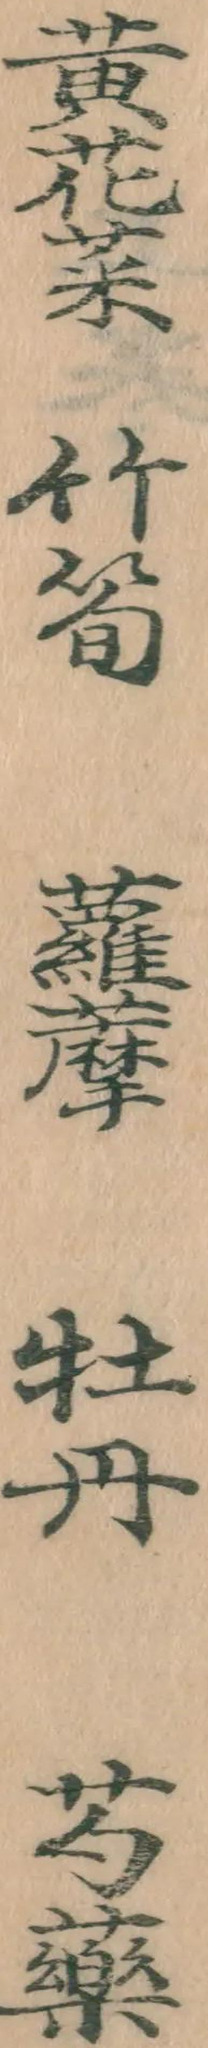黄花菜竹筍蘿藦牡丹芍薬
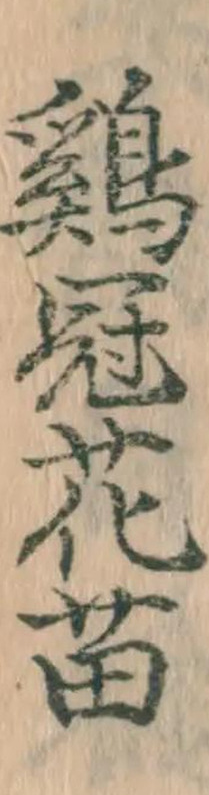鶏冠花苗
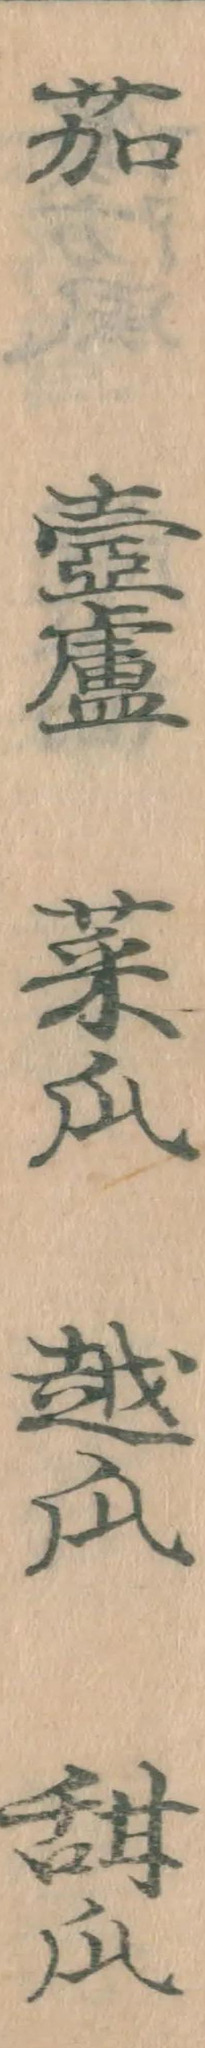茄壺盧菜瓜越瓜甜瓜
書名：菜譜 3巻
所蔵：国立国会図書館 National Diet Library, JAPAN
